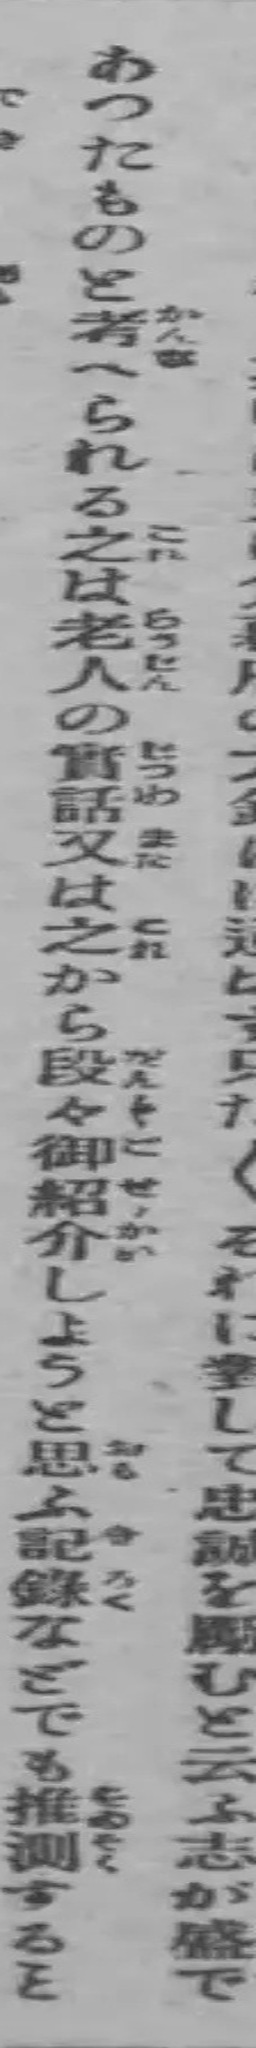あつたものと考へられる之は老人の実話又は之から段々御紹介しようと思ふ記録などでも推測すること
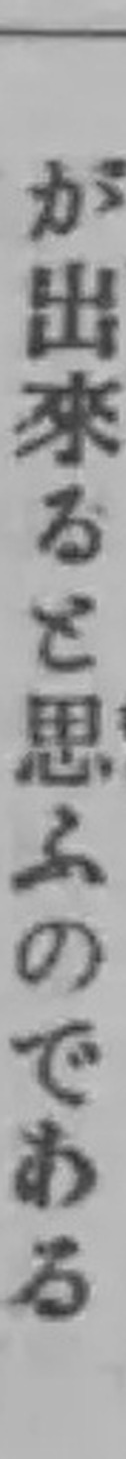が出来ると思ふのである
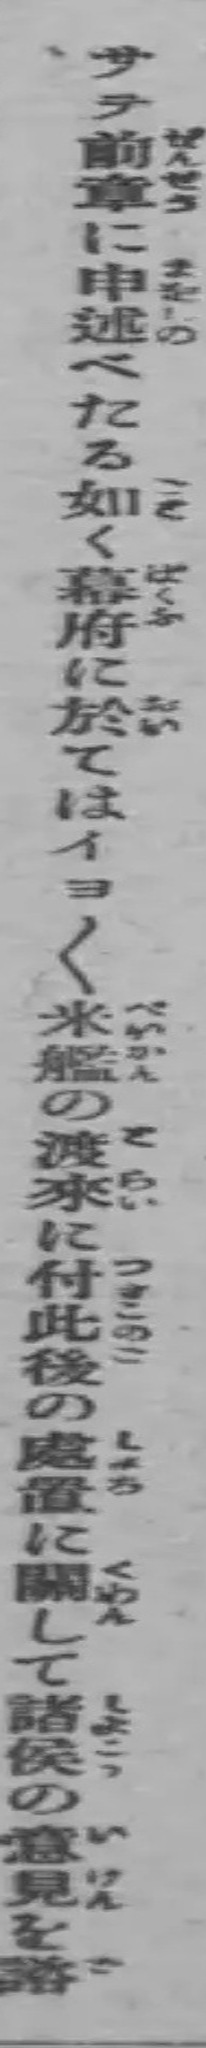サテ前章に申述べたる如く幕府に於てはイヨ〳〵米艦の渡来に付此後の処置に関して諸侯の意見を諮
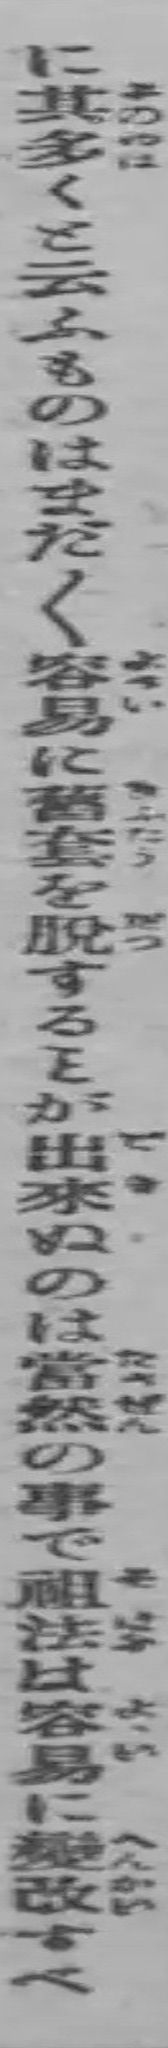に其多くと云ふものはまだ〳〵容易に旧套を脱することが出来ぬのは当然の事で祖法は容易に変改すべ
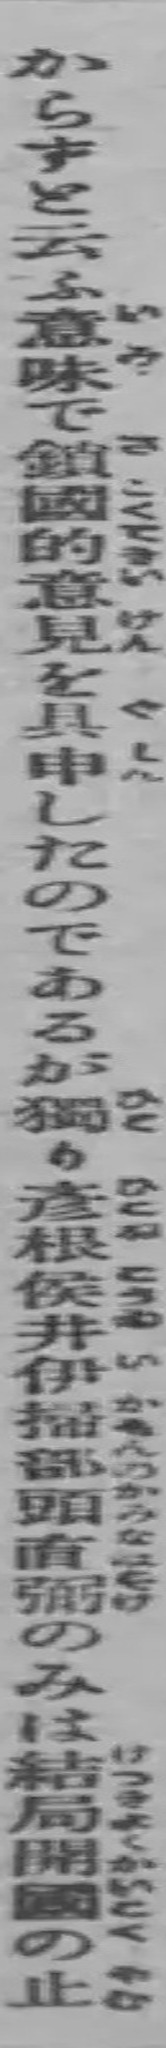からずと云ふ意味で鎖国的意見を具申したのであるが独り彦根侯井伊掃部守直弼のみは結局開国の止
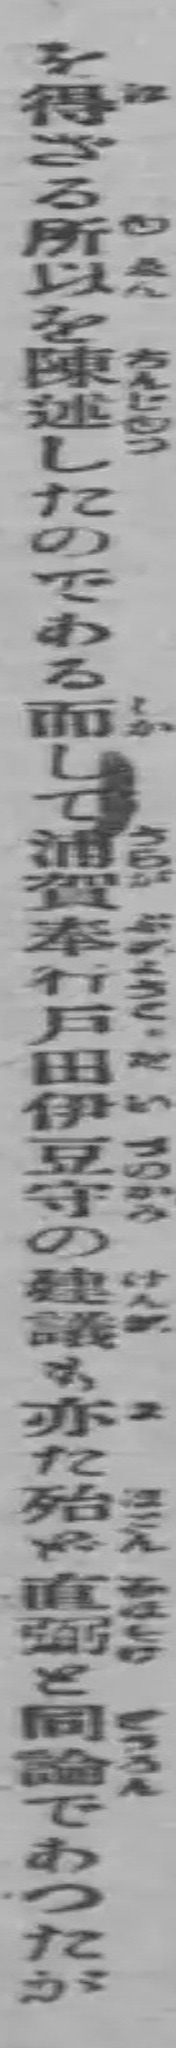を得ざる所以を陳述したのである而して浦賀奉行戸田伊豆守の建議も亦た殆ど直弼と同論であつたが
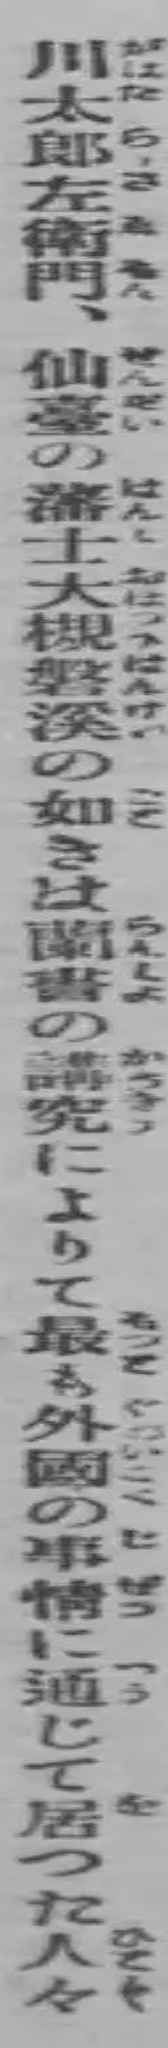川太郎左衛門、仙台の藩士大槻磐渓の如きは蘭書の講究によりて最も外国の事情に通じて居つた人々
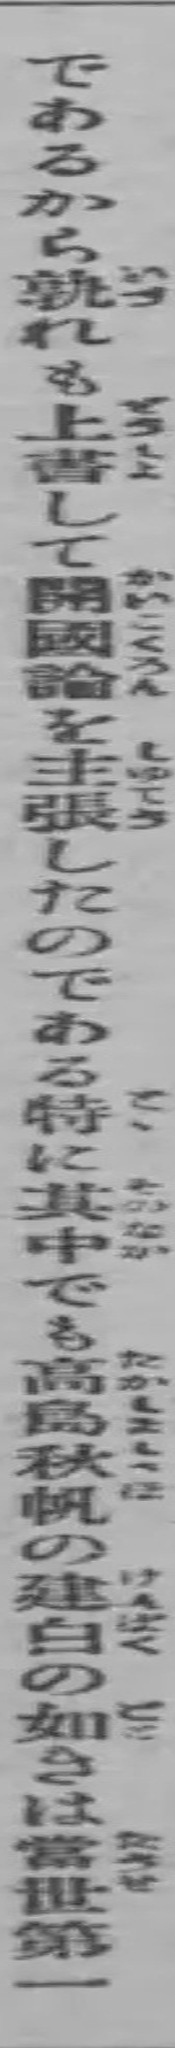であるから孰れも上書して開国論を主張したのである特に其中でも高島秋帆の建白の如きは当世第一
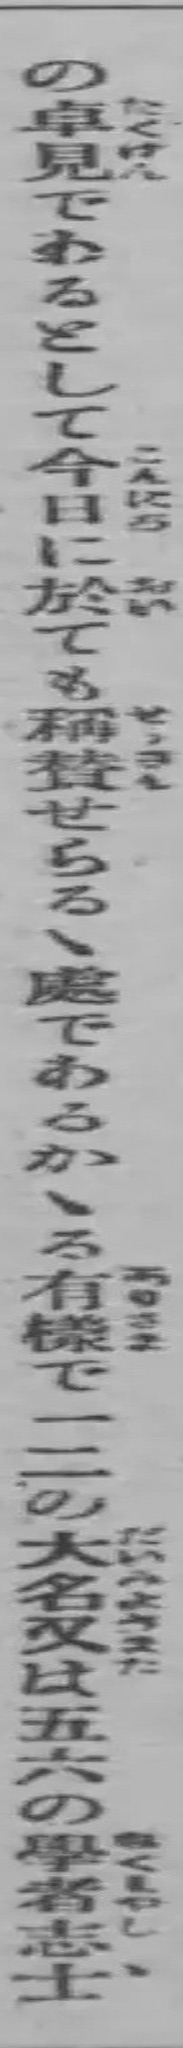の卓見であるとして今日に於ても称賛せらるゝ処であるかゝる有様で一二の大名又は五六の学者志士
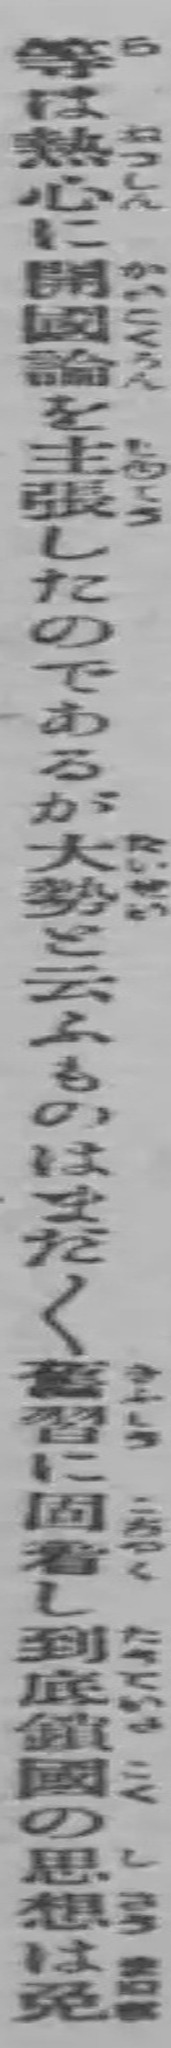等は熱心に開国論を主張したのであるが大勢と云ふものはまだ〳〵旧習に固着し到底鎖国の思想は免
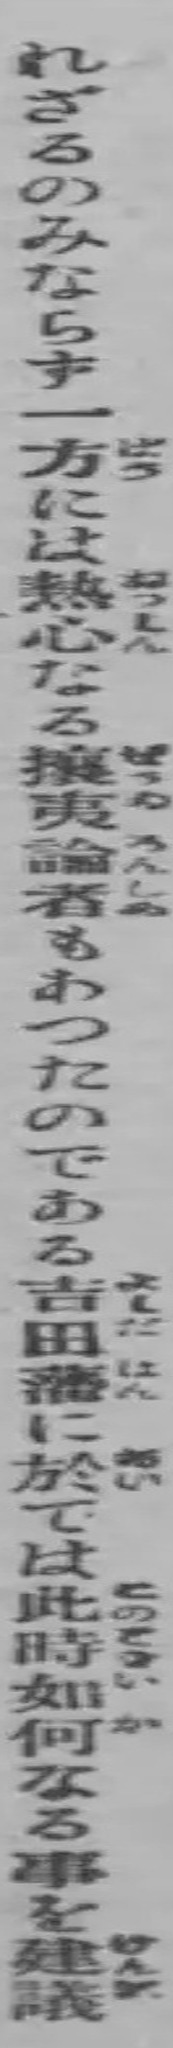れざるのみならず一方には熱心なる攘夷論者もあつたのである吉田藩に於ては此時如何なる事を建議
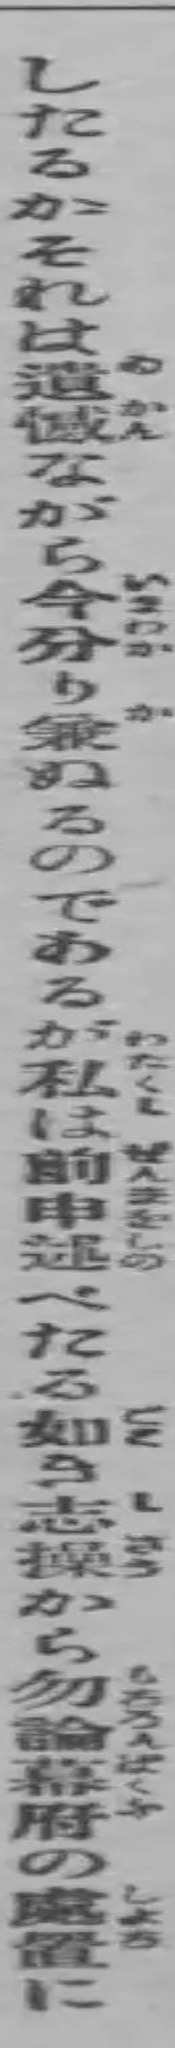したるかそれは遺憾ながら今分り兼ぬるのであるが私は前申述べたる如き志操から勿論幕府の処置に
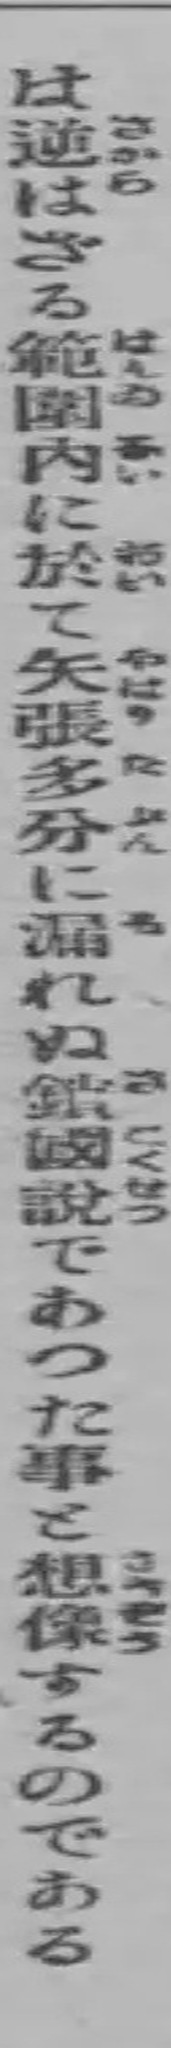は逆はざる範囲内に於て矢張多分に漏れぬ鎖国説であつた事と想像するのである
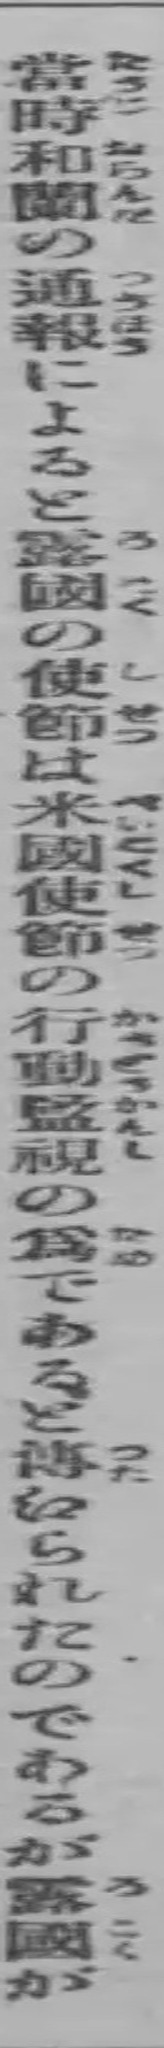当時和蘭の通報によると露国の使節は米国使節の行動監視の為であると伝えられたのであるが露国が
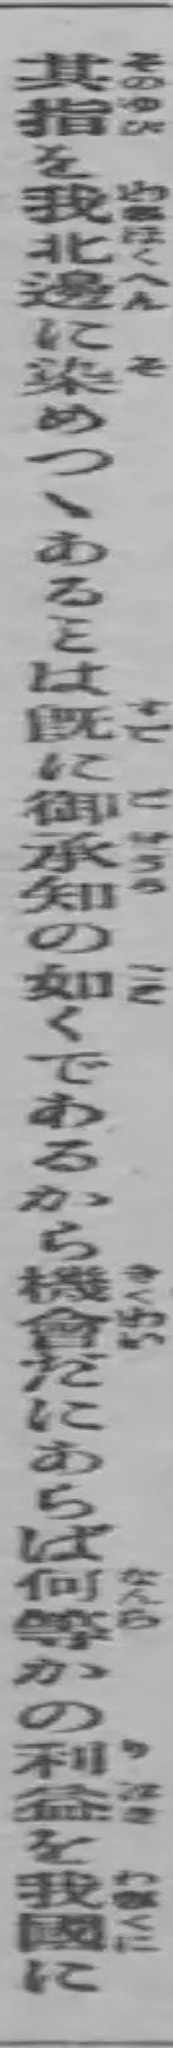其指を我北辺に染めつゝあることは既に御承知の如くであるから機会だにあらば何等かの利益を我国に
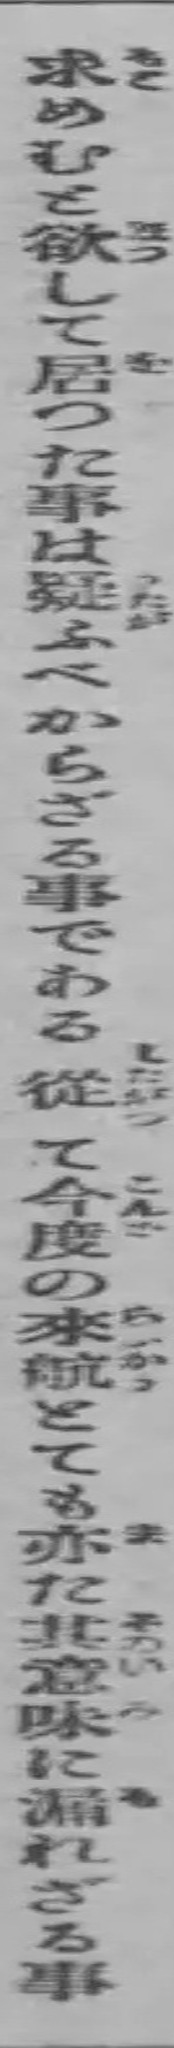求めむと欲して居つた事は疑ふべからざる事である従て今度の来航とても亦た其意味に漏れざる事
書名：豊橋市史談
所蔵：国立国会図書館 National Diet Library, JAPAN
